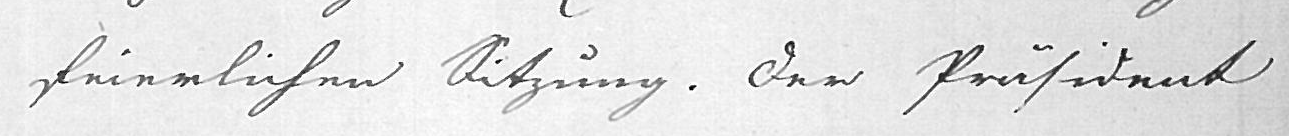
feierlichen Sitzung. Der Präsident
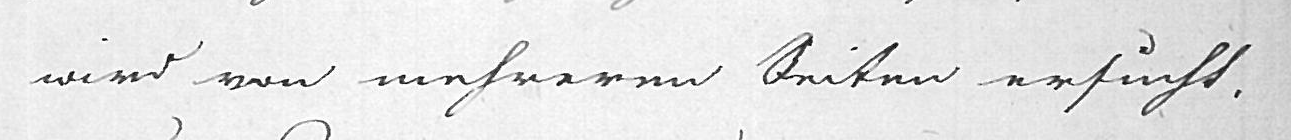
wird von mehreren Seiten ersucht,
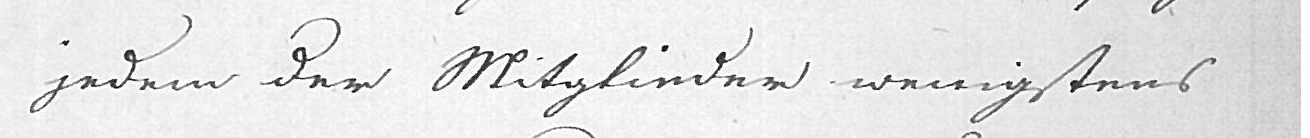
jedem der Mitglieder wenigstens
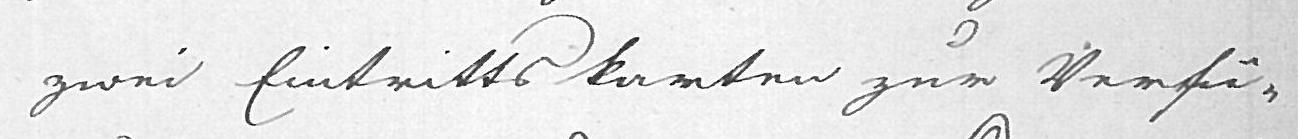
zwei Eintrittskarten zur Verfü-
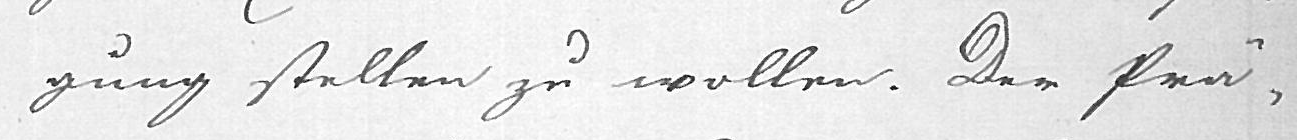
gung stellen zu wollen. Der Prä-
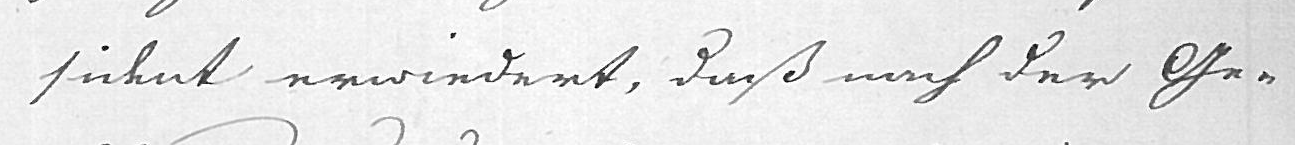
sident erwiedert, daß nach der Ge-
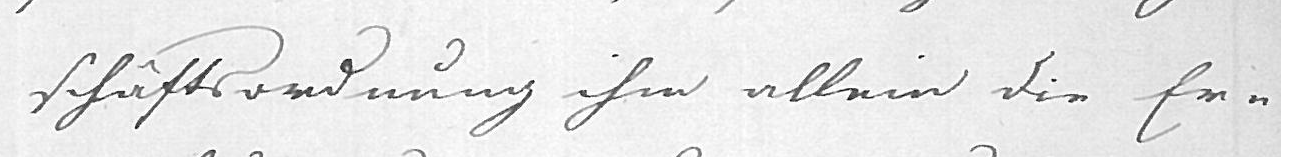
schäftsordnung ihm allein die Er-
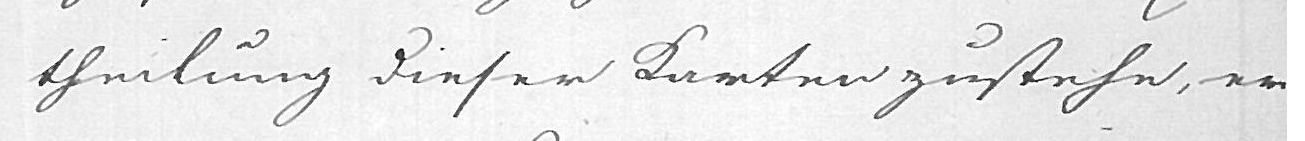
theilung dieser Karten zustehe, er
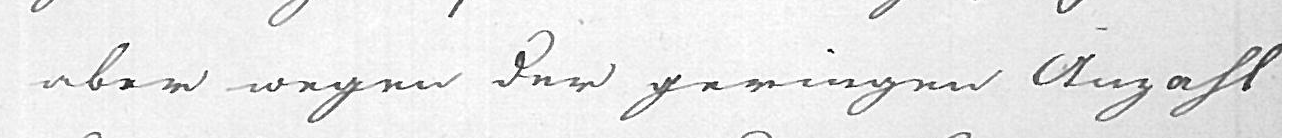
aber wegen der geringen Anzahl
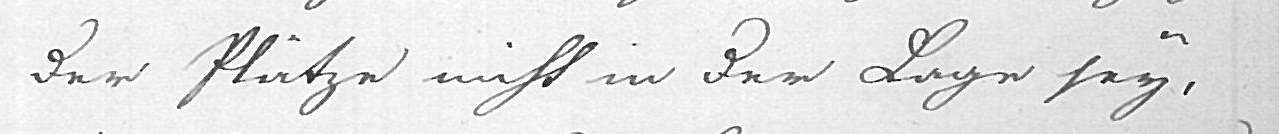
der Plätze nicht in der Lage sey,
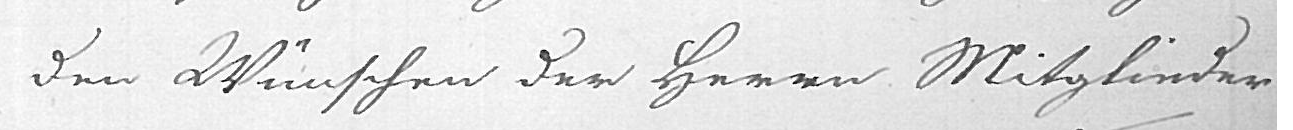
den Wünsches der Herrn Mitglieder
